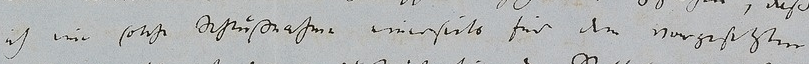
ich eine solche Schlußnahme einerseits für den vorgesetzten
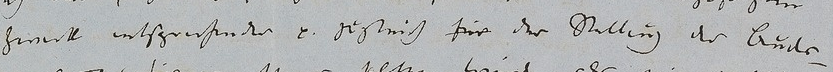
Zweck entsprechender &. zugleich für der Stellung der Bundes-
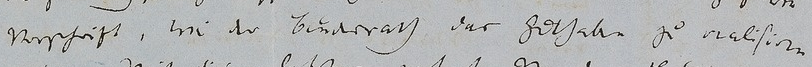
Vorschrift, wie der Bundesrath das Guthaben zu realisiren
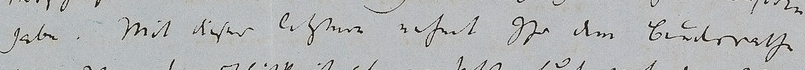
habe. Mit dieser letztern nehmt Ihr dem Bundesrathe
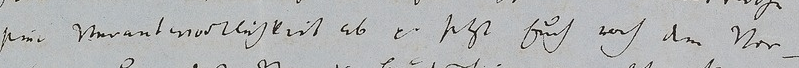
seine Verantwortlichkeit ab &. setzt Euch noch dem Vor-
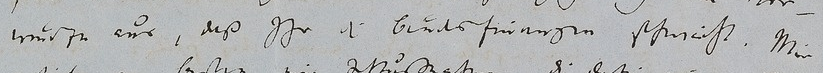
wurfe aus, daß Ihr die Bundesfinanzen schwächt. Mir
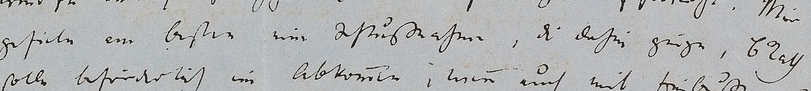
gefiele am besten eine Schlußnahme, die dahin ginge, BRath
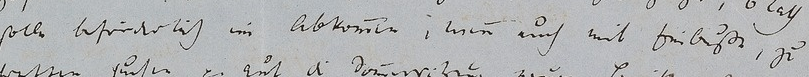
solle beförderlich ein Abkommen; wenn auch mit Einbuße, zu
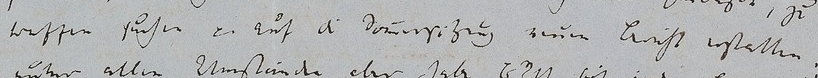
treffen suchen &. auf die Sommersitzung neuen Bericht erstatten;
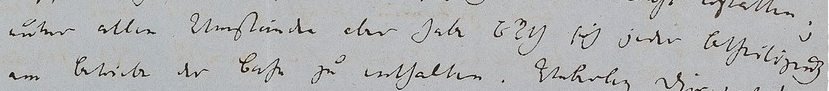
unter allen Umständen aber habe BRath sich jeder Betheiligung
